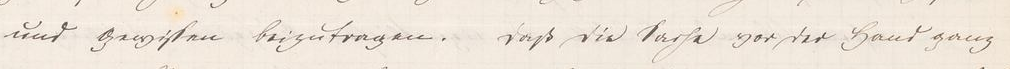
und Gewissen beizutragen. Daß die Sache vor der Hand ganz
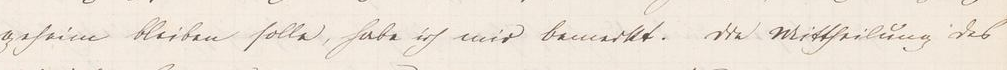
geheim bleiben solle, habe ich mir bemerkt. Die Mittheilung des
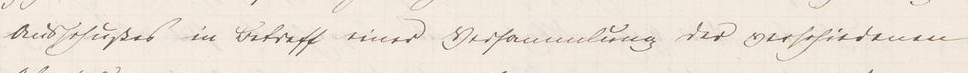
Ausschußes in Betreff einer Versammlung der verschiedenen
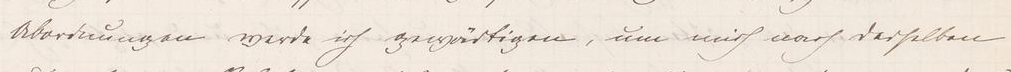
Abordnungen werde ich gewärtigen, um mich nach derselben
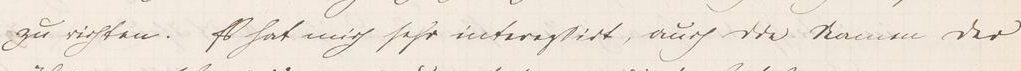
zu richten. Es hat mich sehr intereßirt, auch die Namen der
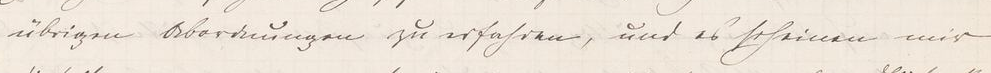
übrigen Abordnungen zu erfahren, und es scheinen mir
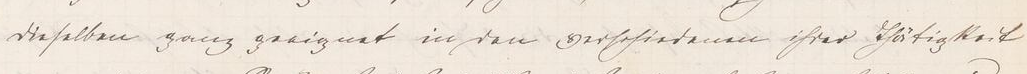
dieselben ganz geeignet in den verschiedenen ihrer Thätigkeit
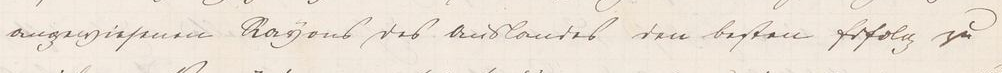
angewiesenen Rayons des Auslandes den besten Erfolg zu
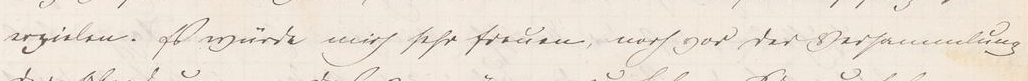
erzielen. Es würde mich sehr freuen, noch vor der Versammlung
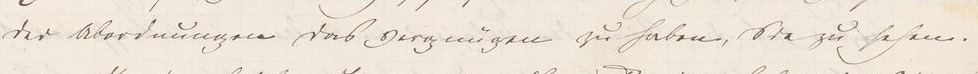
der Abordnungen das Vergnügen zu haben, Sie zu sehen.
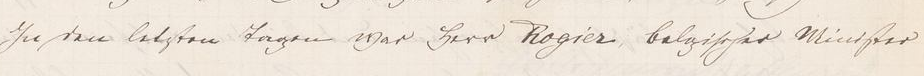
In den letzten Tagen war Herr Rogierbelgischer
